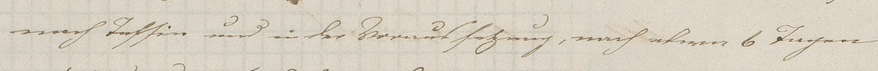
nach Tessin und in der Voraussetzung, nach etwa 6 Tagen
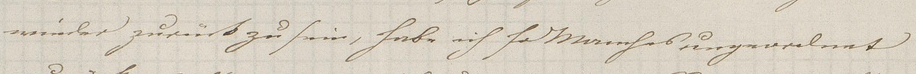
wieder zurück zu sein, habe ich so Manches ungeordnet
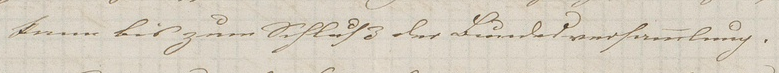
kann bis zum Schluß der Bundesversammlung.
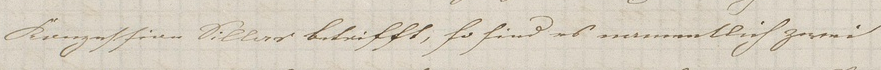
Konzession Sillar betrifft, so sind es namentlich zwei
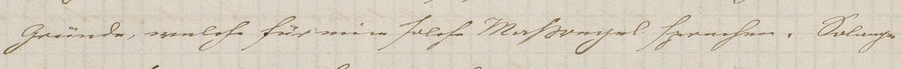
Gründe, welche für eine solche Maßregel sprechen. Solange
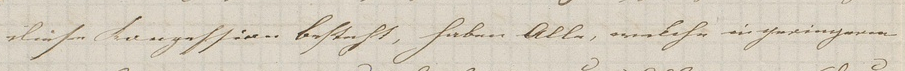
diese Konzession besteht, haben Alle, welche in geringerm
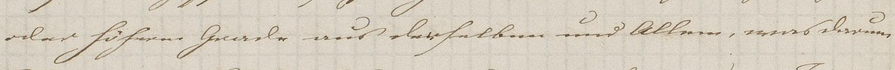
oder höherm Grade aus derselben und Allem, was darum
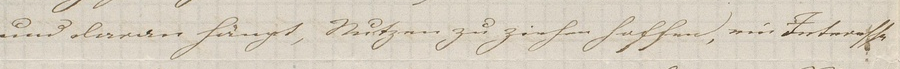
und daran hängt, Nutzen zu ziehen hoffen, ein Interesse
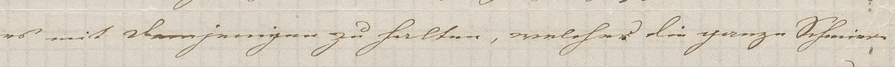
es mit demjenigen zu halten, welcher die ganze Schmiere
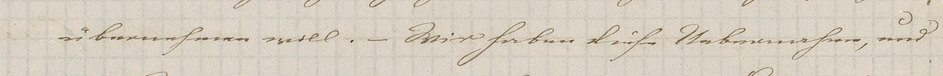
übernehmen will. – Wir haben diese Uebernahme, und
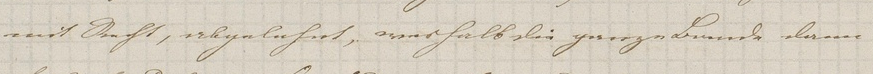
mit Recht, abgelehnt, weshalb die ganze Bande dann
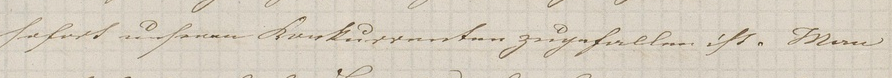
sofort unseren Konkurrenten zugefallen ist. Man
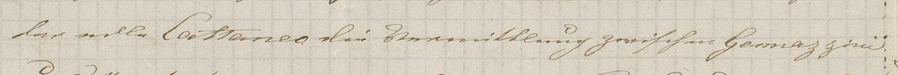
der edle Cattaneo die Vermittlung zwischen Gennazzini
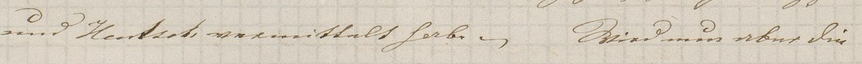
und Hentsch vermittelt habe. Wird nun aber die
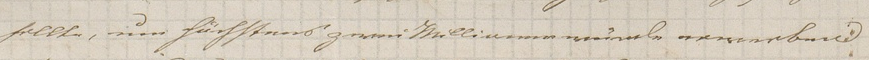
sollte, um höchstens zwei Millionen würde erwerben
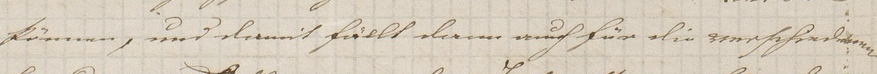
können, und damit fällt dann auch für die verschiedenen
